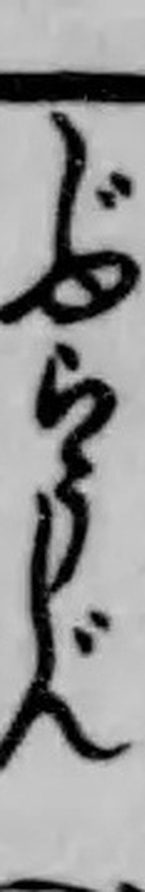じゆらうじん
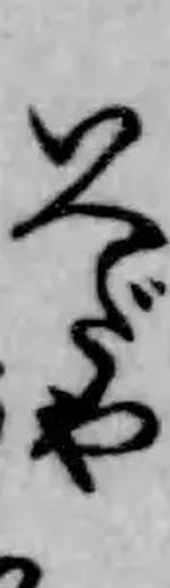いへだや

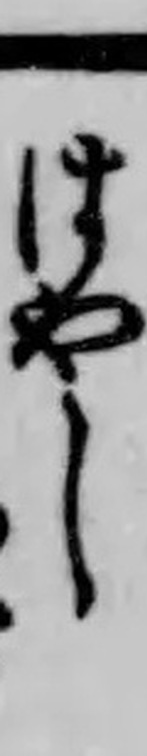はやし
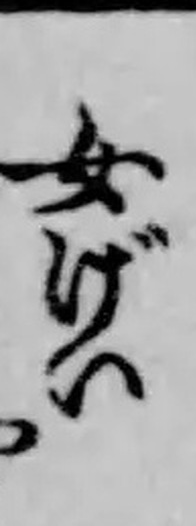女げい
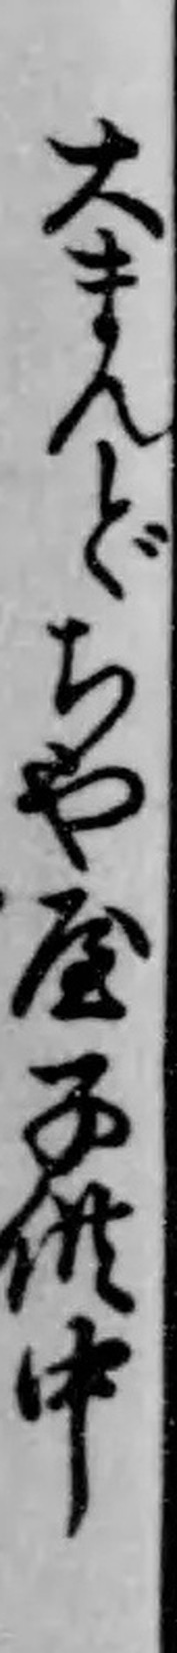大まんどちや屋子供中
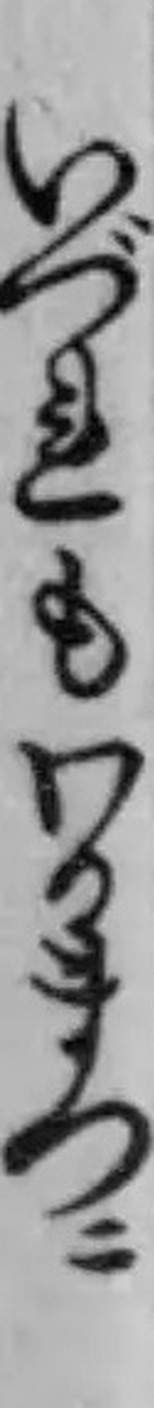いづれもわかまつに
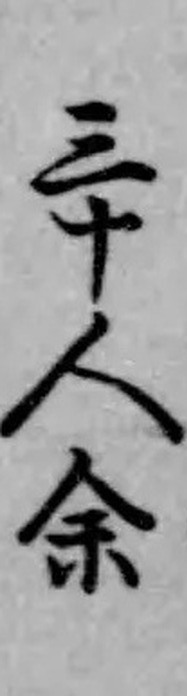三十人余
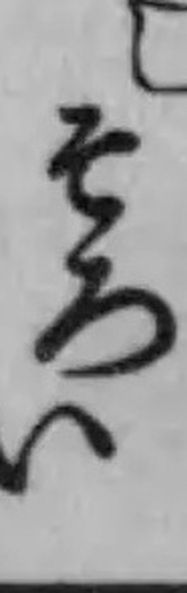そろい
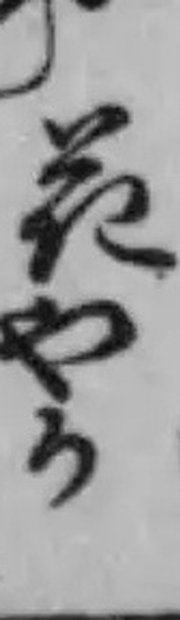花やか

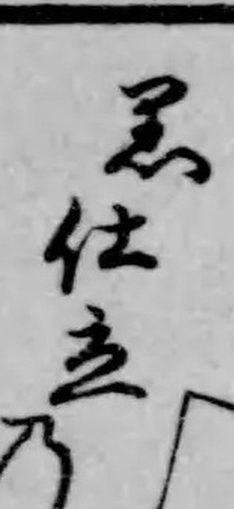黒仕立の
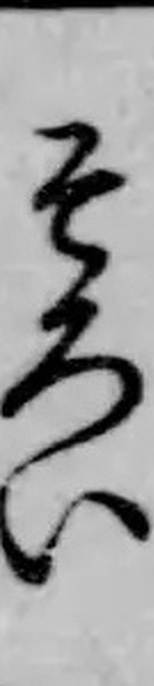そろい
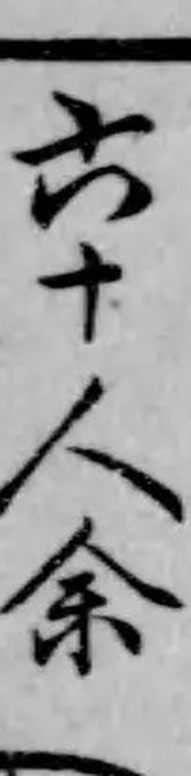六十人余

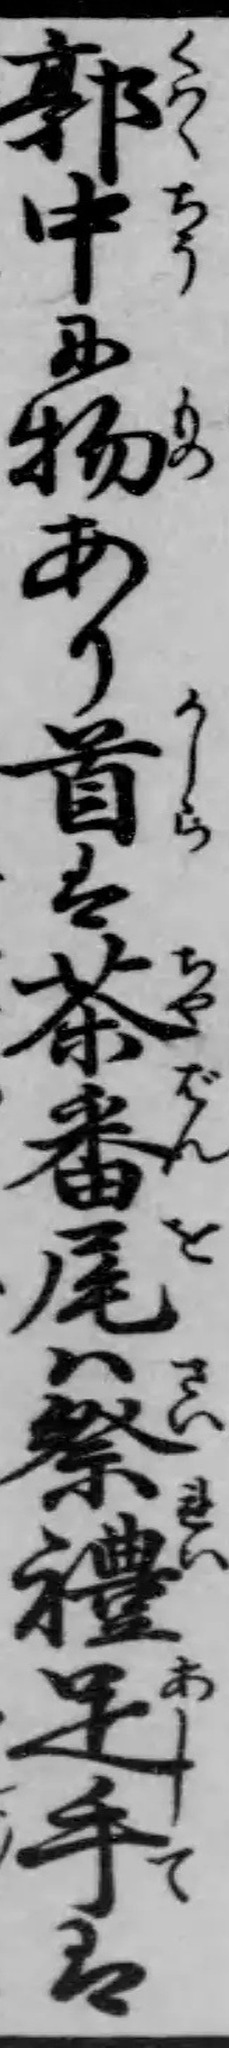郭中に物あり首は茶番尾は祭礼足手は
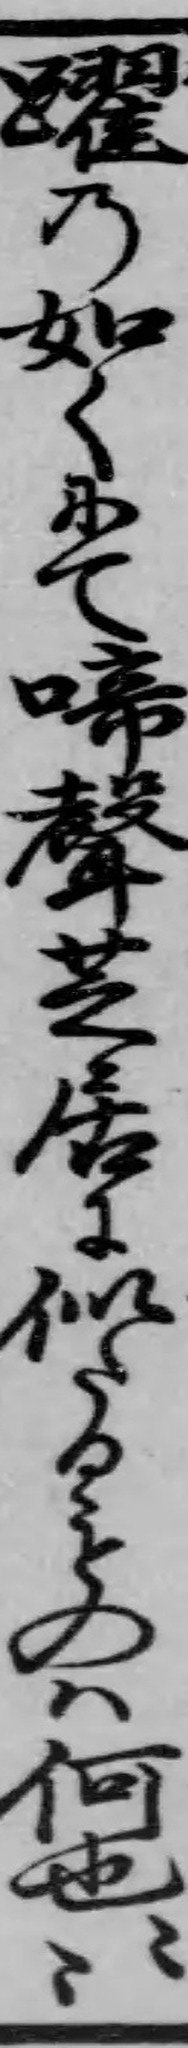躍の如くにて啼声芝居に似たるものは何也々々
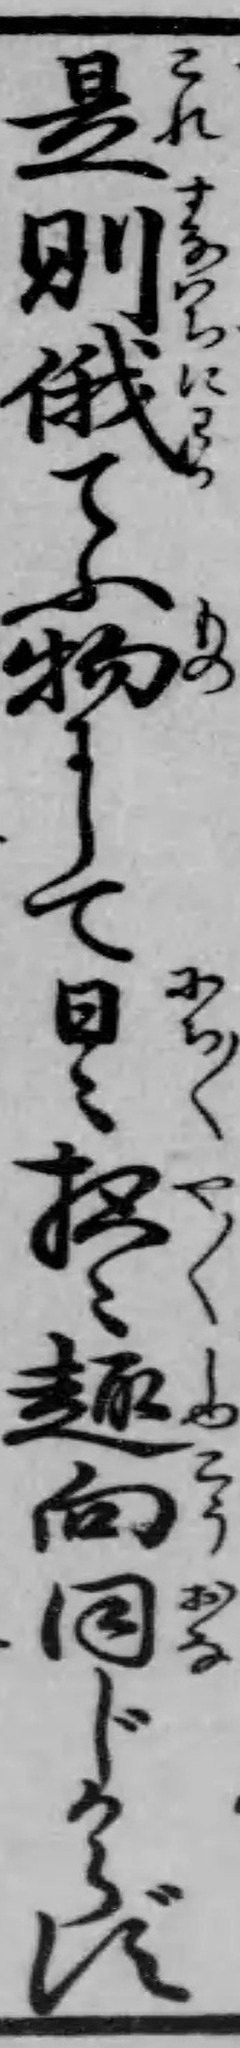是則俄てふ物にして日々夜々趣向同じからず
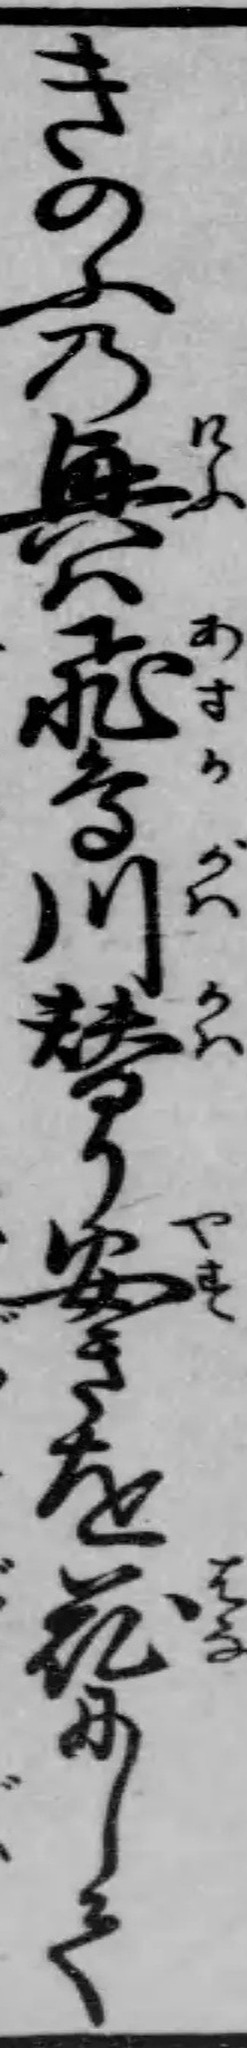きのふの興は飛鳥川替り安きを花にして
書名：明月余情. 第1編
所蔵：国立国会図書館 National Diet Library, JAPAN
